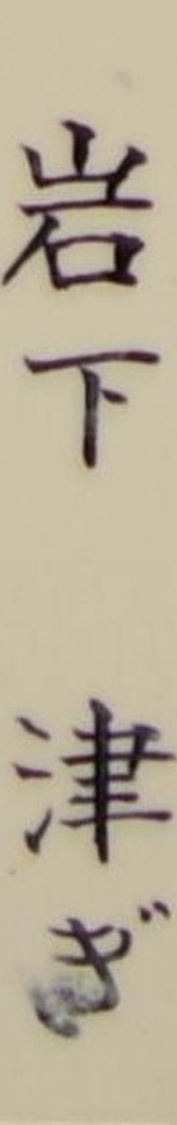岩下つぎ
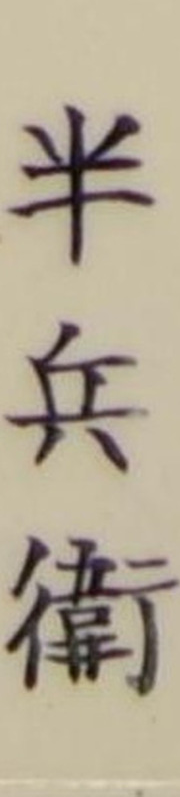半兵衛
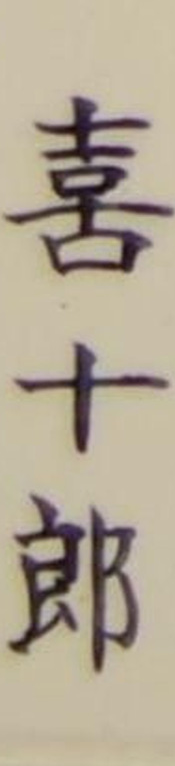喜十郎
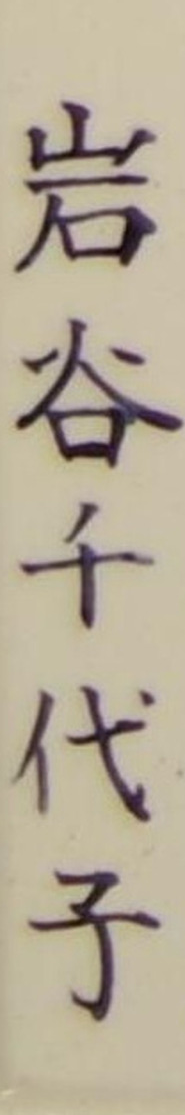岩谷千代子

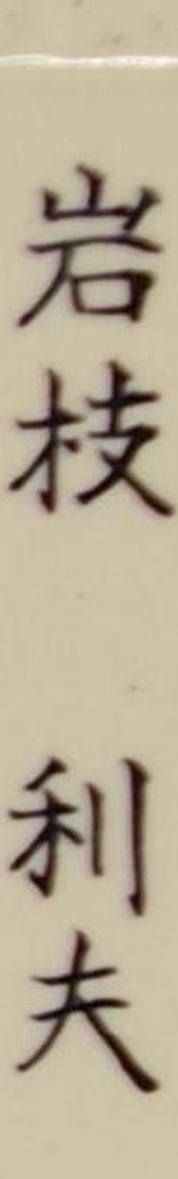岩枝利夫
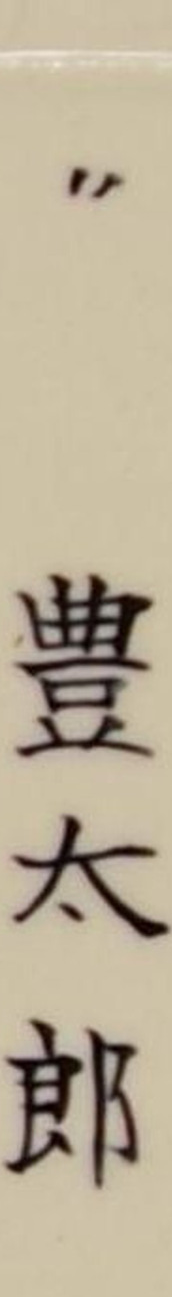豊太郎
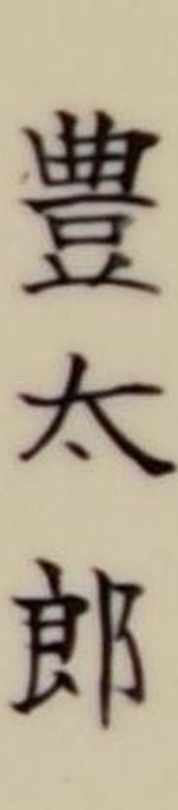豊太郎
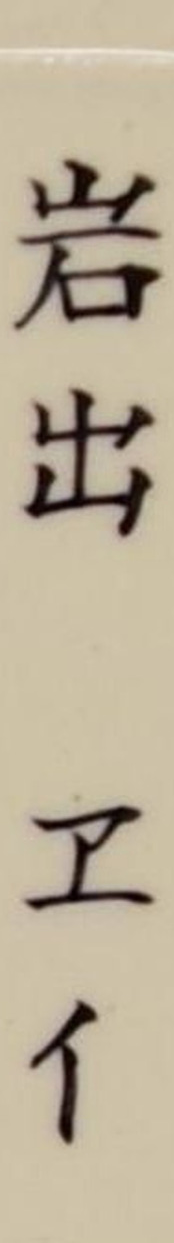岩出ヱイ
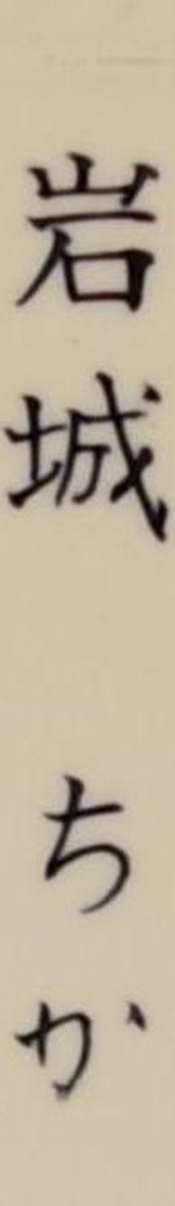岩城ちか
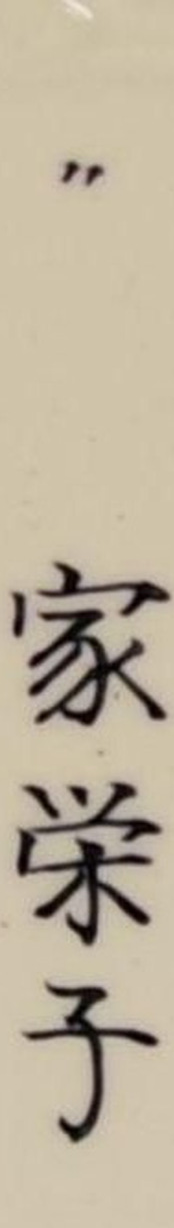家栄子
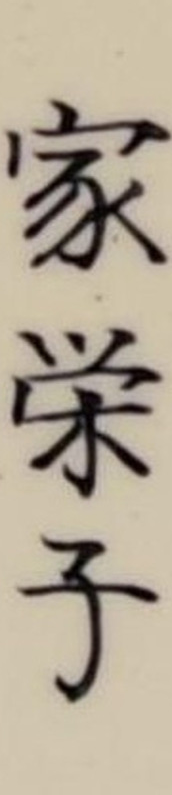家栄子
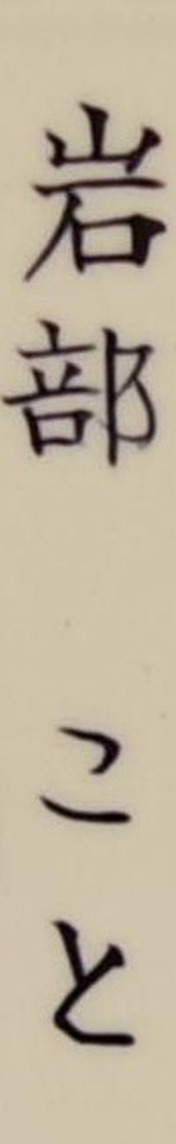岩部こと
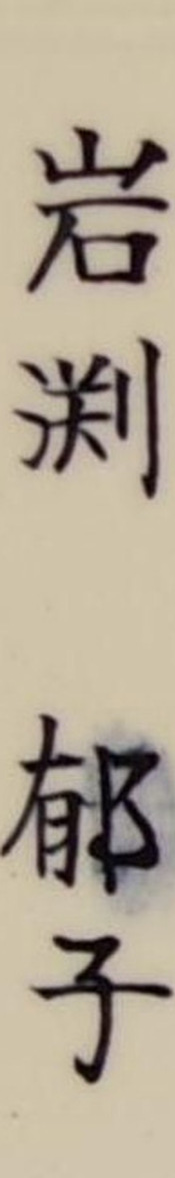岩淵郁子
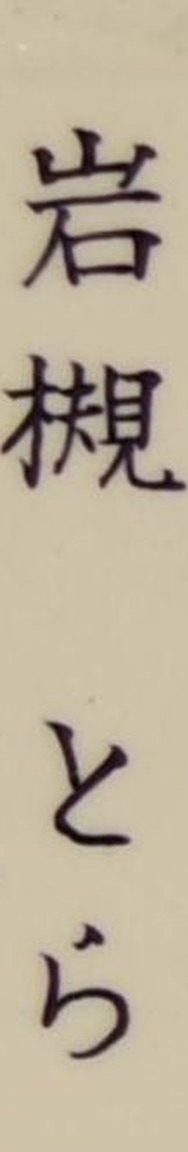岩槻とら
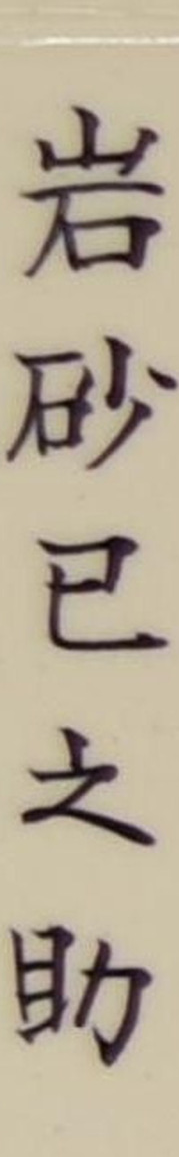岩砂巳之助
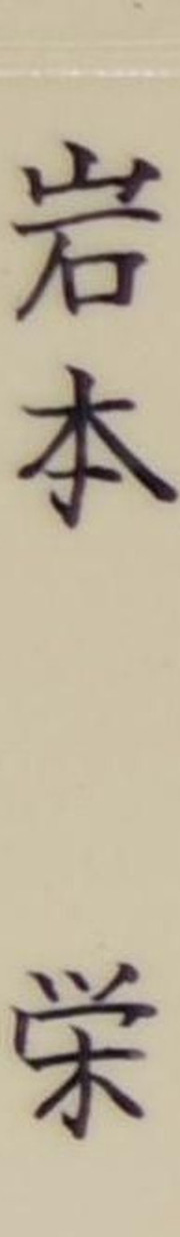岩本栄
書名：A~D
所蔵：koyasan kongobuji
